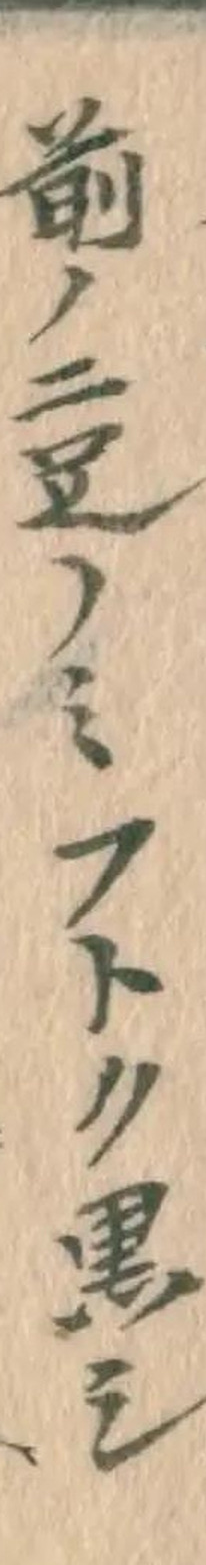前ノ二足ノミフトク黒シ
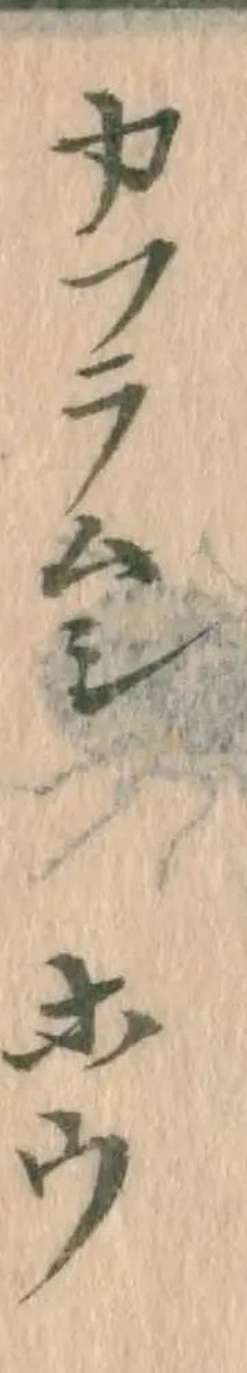カフラムシホウ
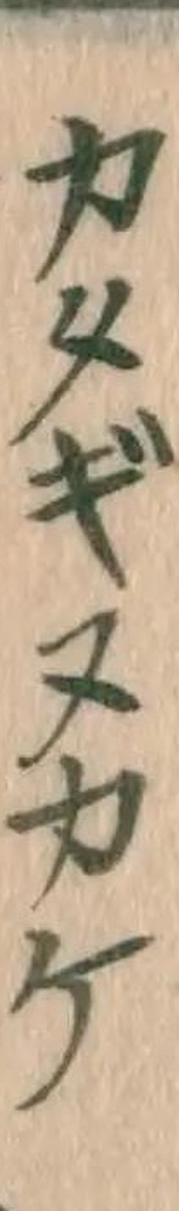カタギヌカケ
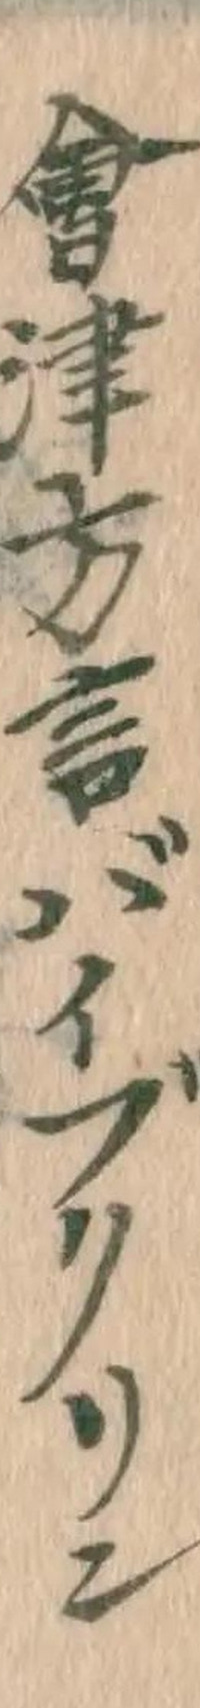會津方言バイブクリン
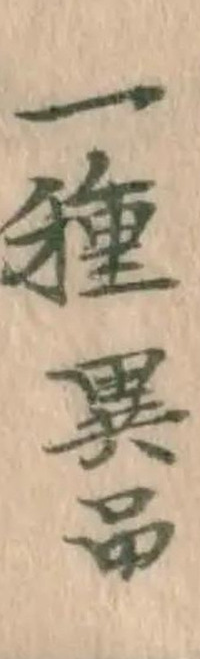一種異品
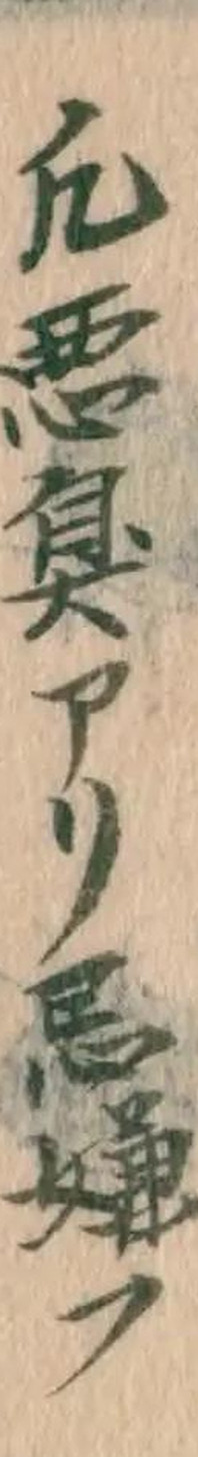凢悪臭アリ忌嫌フ
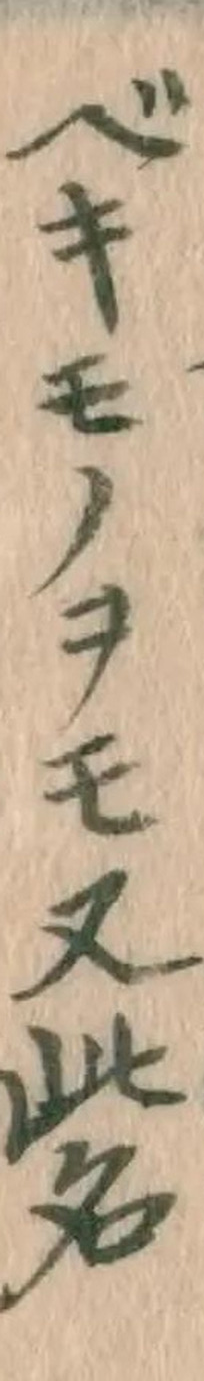ベキモノヲモ又此名
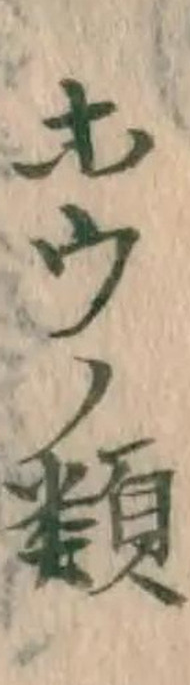ホウノ類
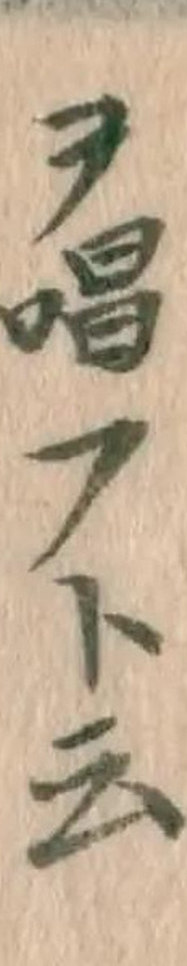ヲ唱フト云
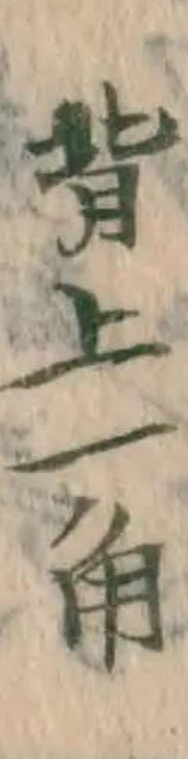背上一角
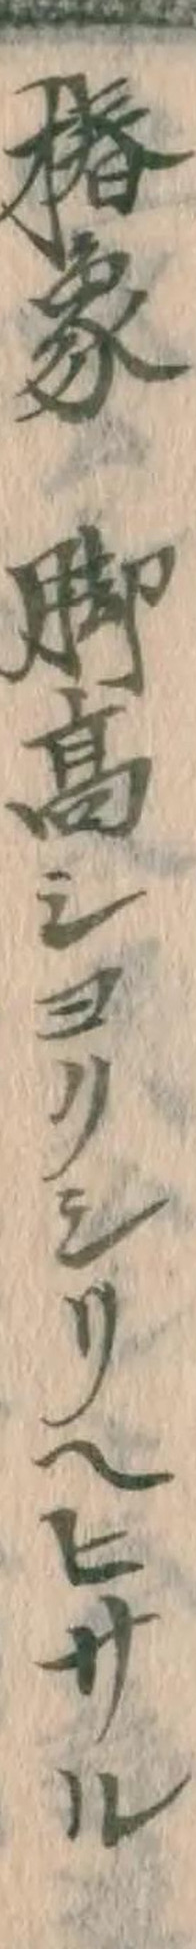椿象脚高シヨクシリヘヒサル
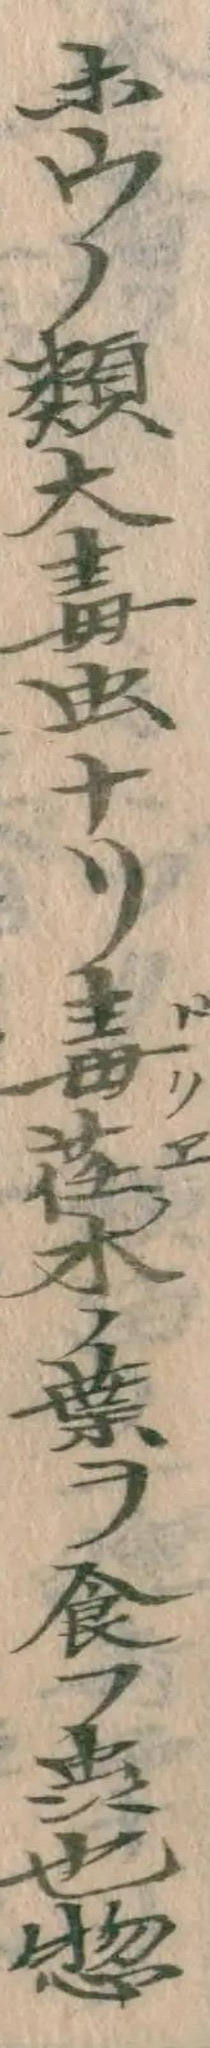ホウノ類大毒虫ナリ毒荏ノ木ノ葉ヲ食フ虫也惣
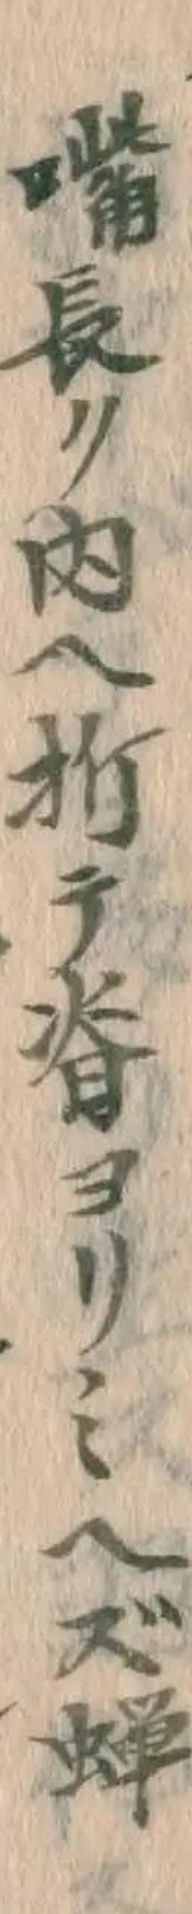嘴長ク内ヘ折テ脊ヨリミヘズ蝉
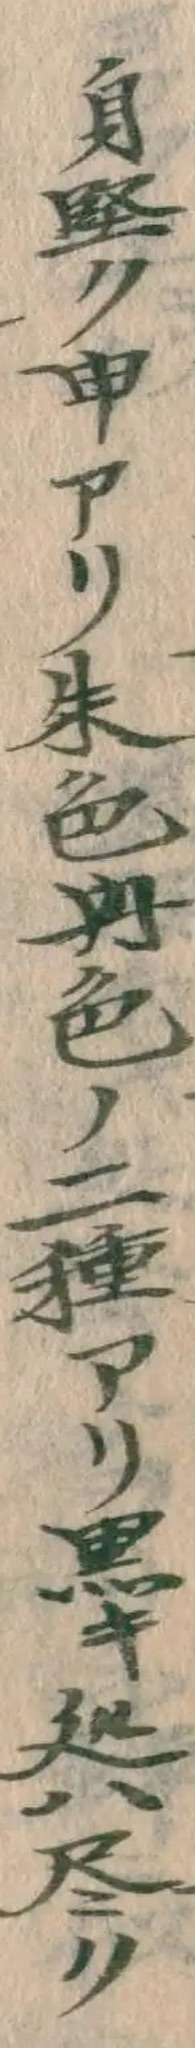身堅ク甲アリ朱色丹色ノ二種アリ黒キ処ハ尽ク
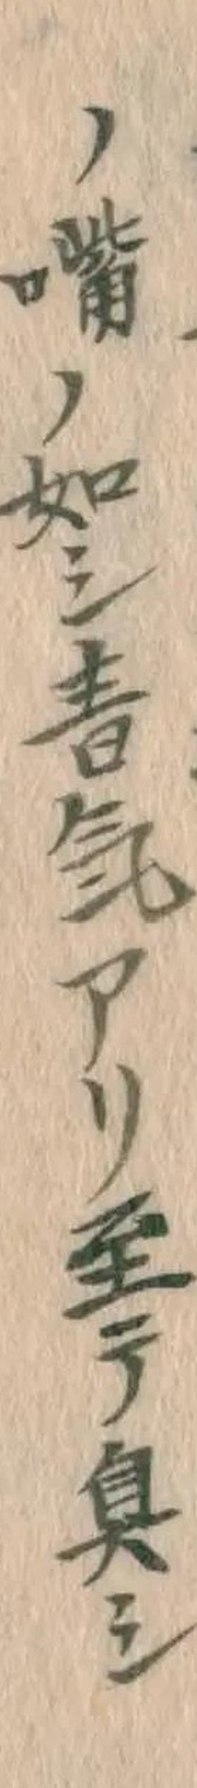ノ嘴ノ如シ青気アリ至テ臭シ
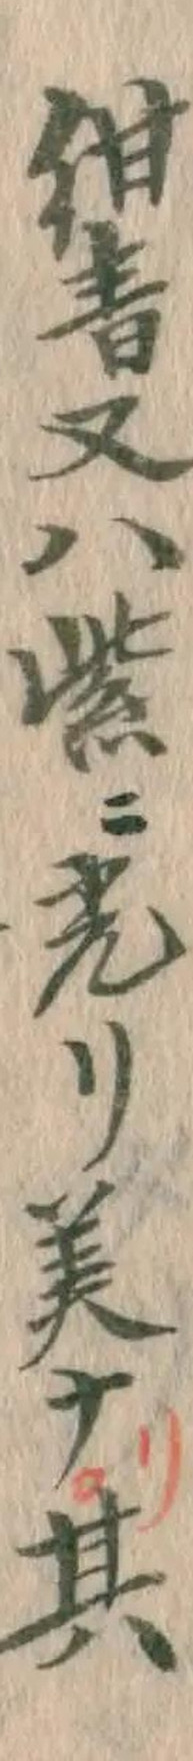紺青又ハ紫ニ光美ナ◦リ其
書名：千蟲譜 3巻. [3]
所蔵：国立国会図書館 National Diet Library, JAPAN
